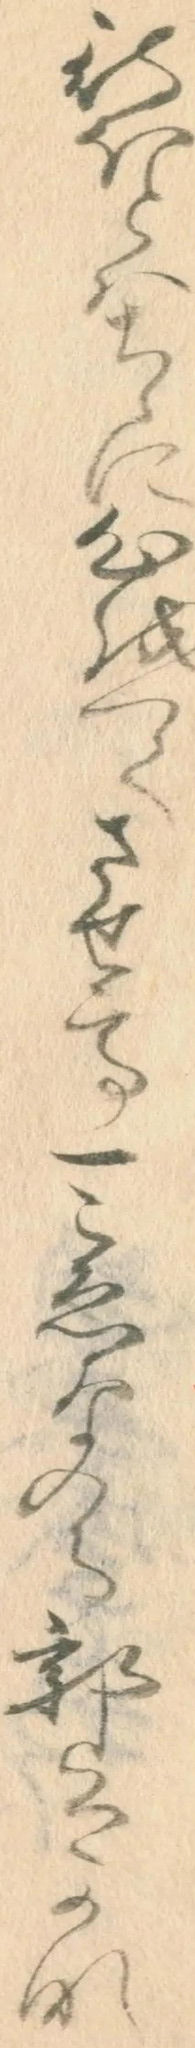待ほとはちゝに心をつくさせて一こゑなのる郭公かな
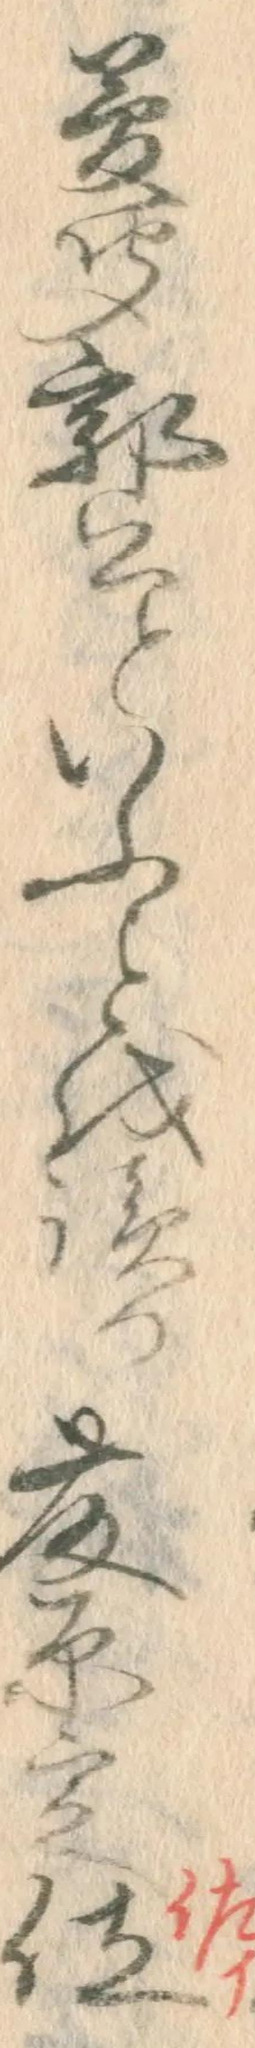夢聞郭公といふことを読る藤原定位
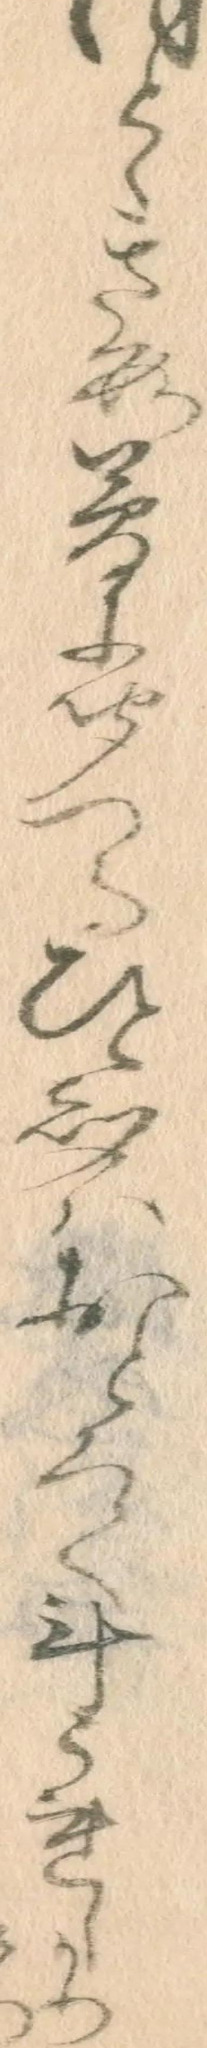ほとゝきす夢に聞つるひと声はおとろく斗うれしかりけり
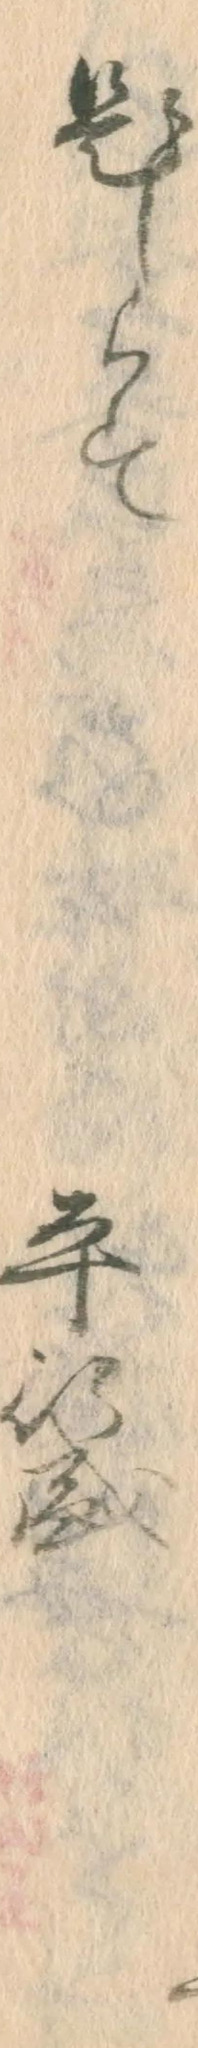題しらす平行盛
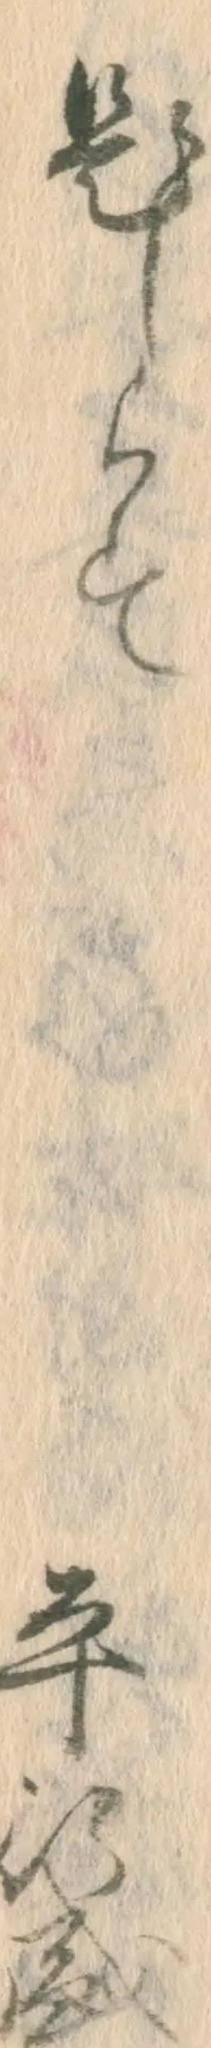題しらす平行盛
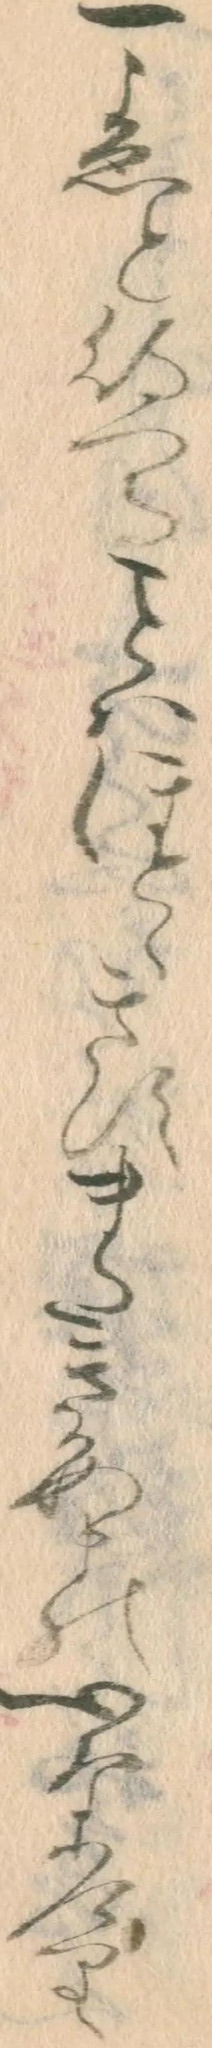一こゑと待つることはほとゝきすまたきかぬまの心なりけり
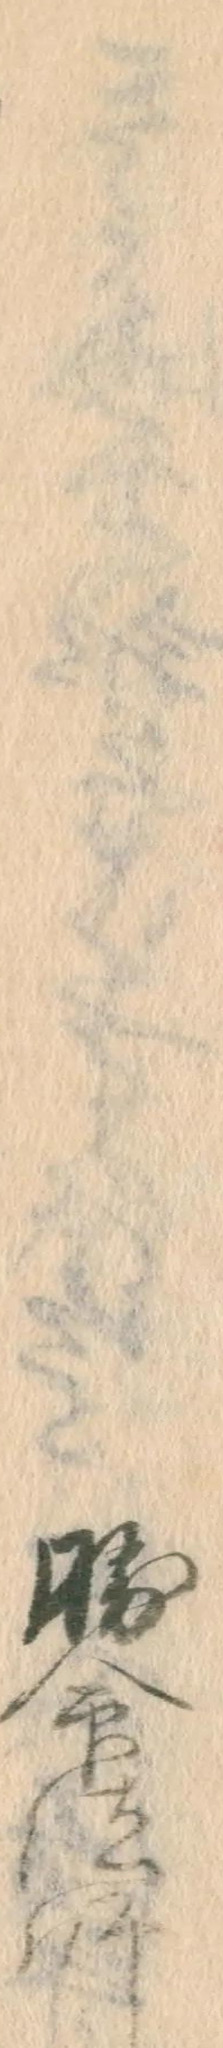勝命法師
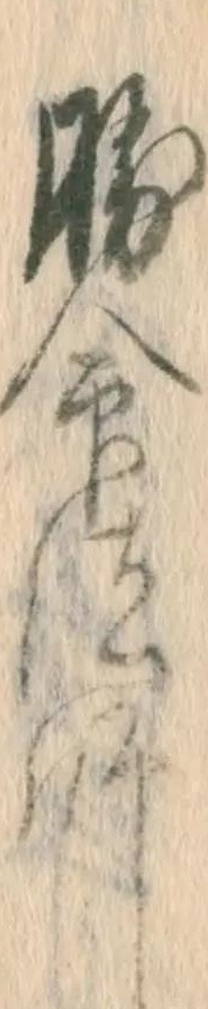勝命法師
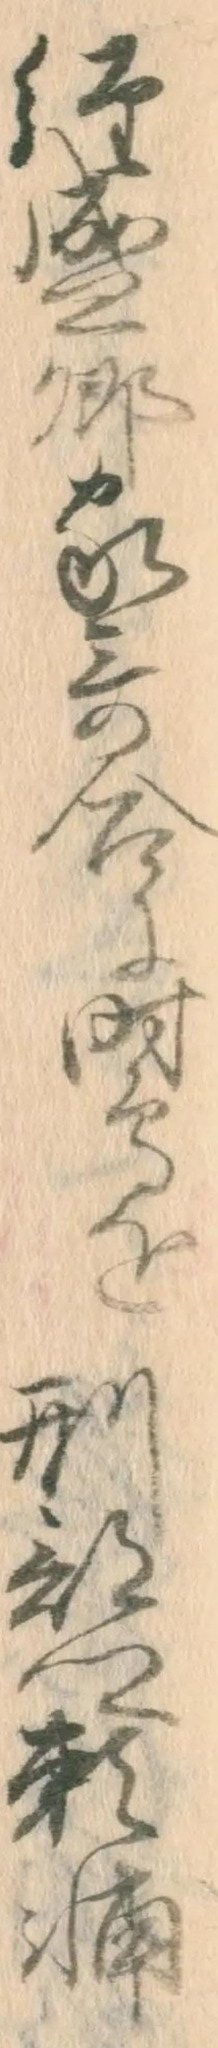経盛卿家歌合に時鳥を刑部卿頼輔
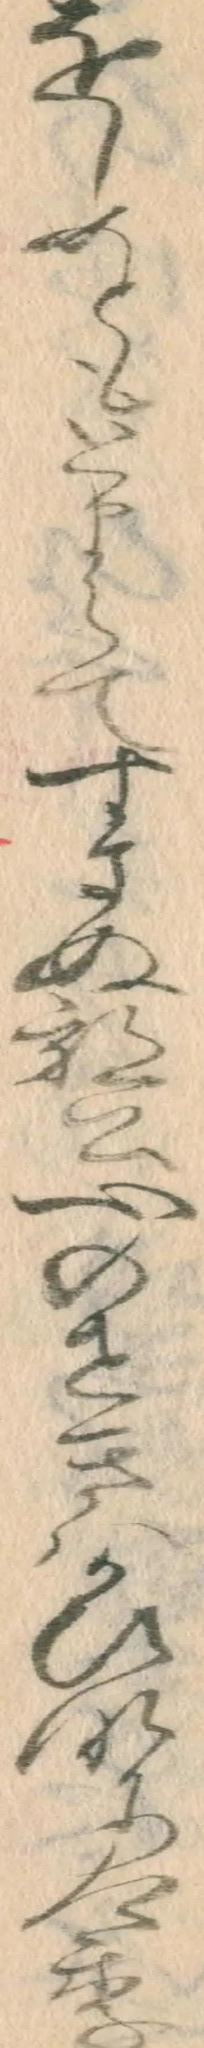をしめともとまらてすきぬ郭公心のせきはかひなかりけり
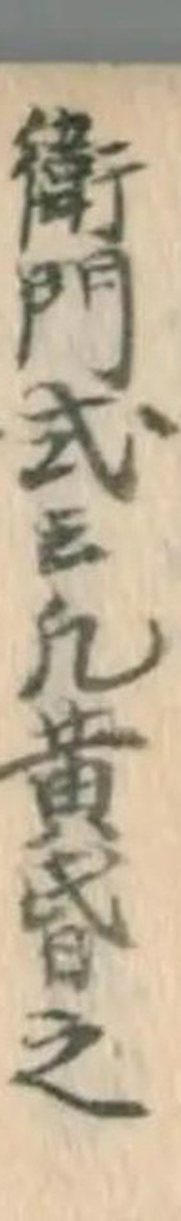衛門式云凡黄昏之
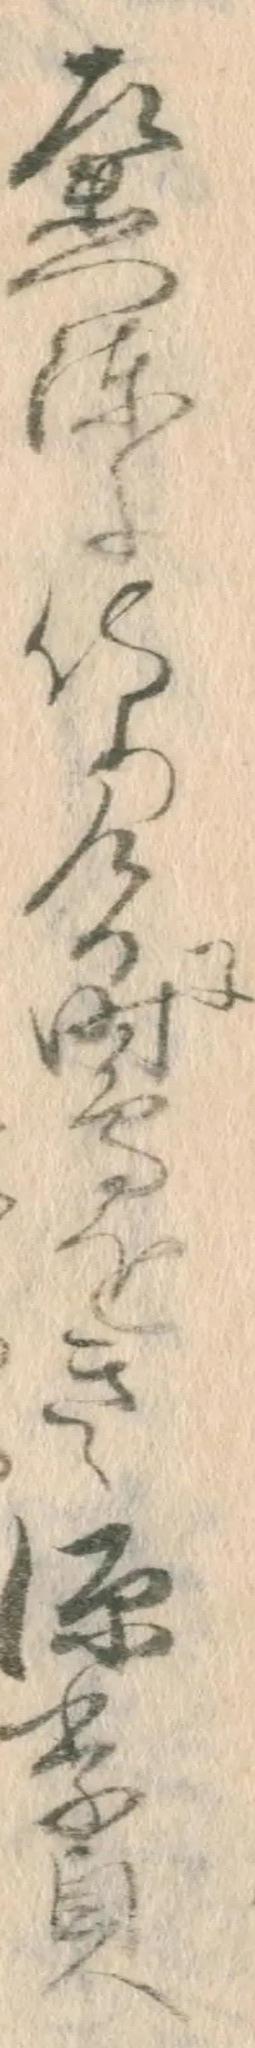左衛門陣に侍りけるに時鳥をきゝ
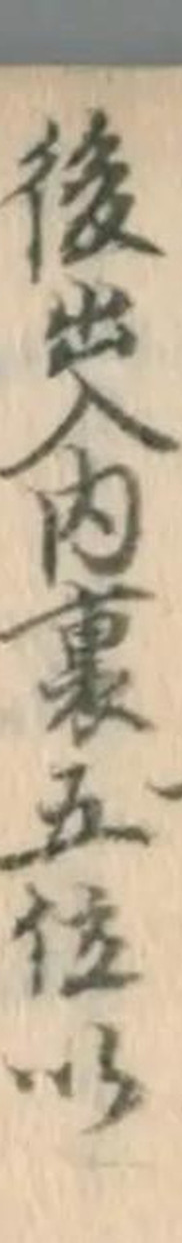後出入内裏五位以
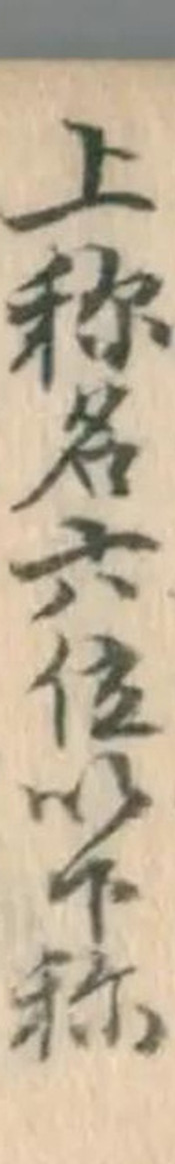上称名六位以下称
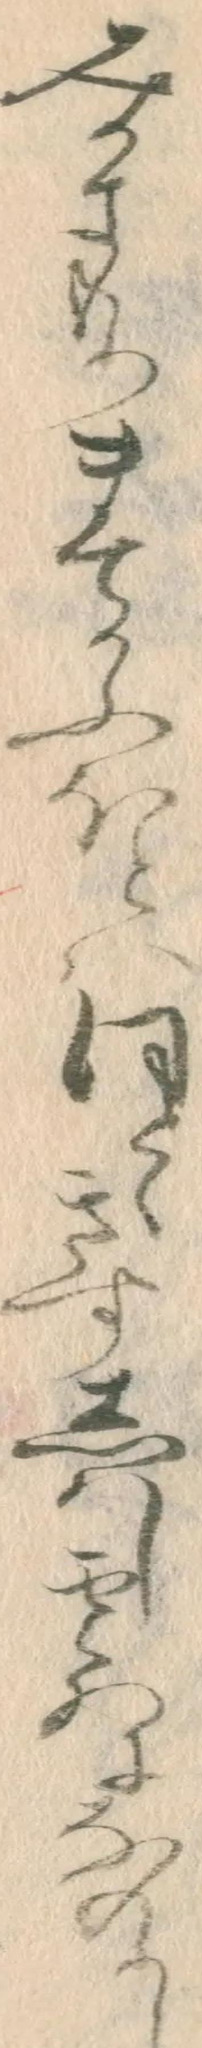みかきもりまてかふほとはほとゝきすしはし雲ゐになのりして行
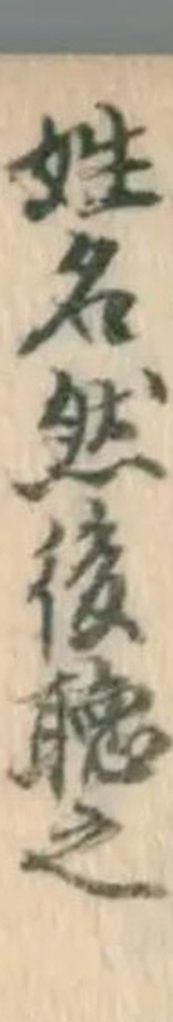姓名然後聴之
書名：月詣和歌集
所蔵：国立国会図書館 National Diet Library, JAPAN
